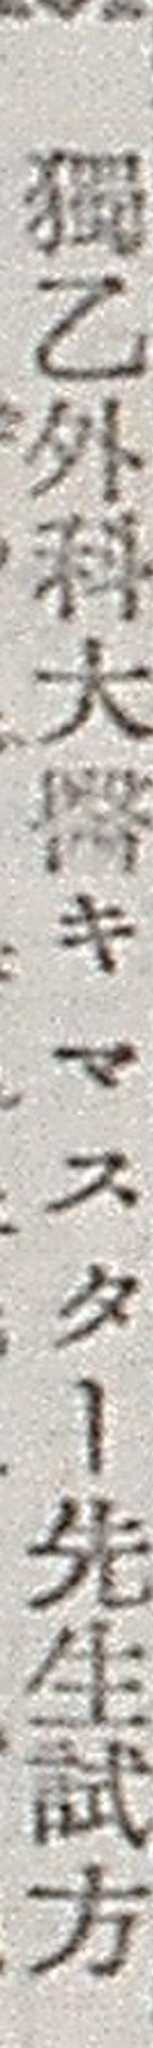獨乙外科大医キマスター先生試方
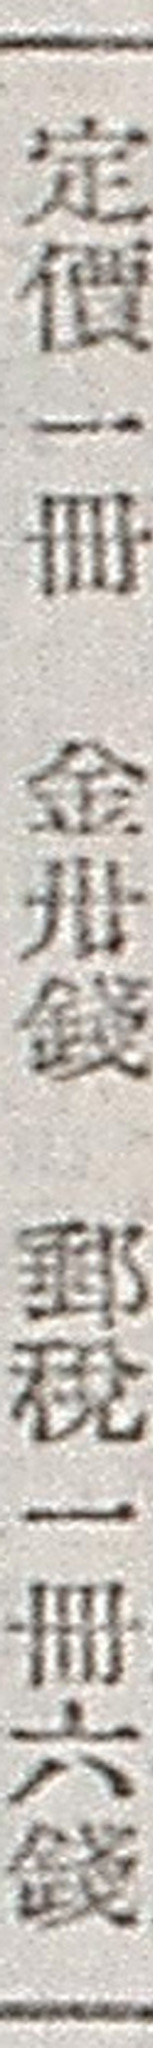定価一冊金卅銭郵税一冊六銭
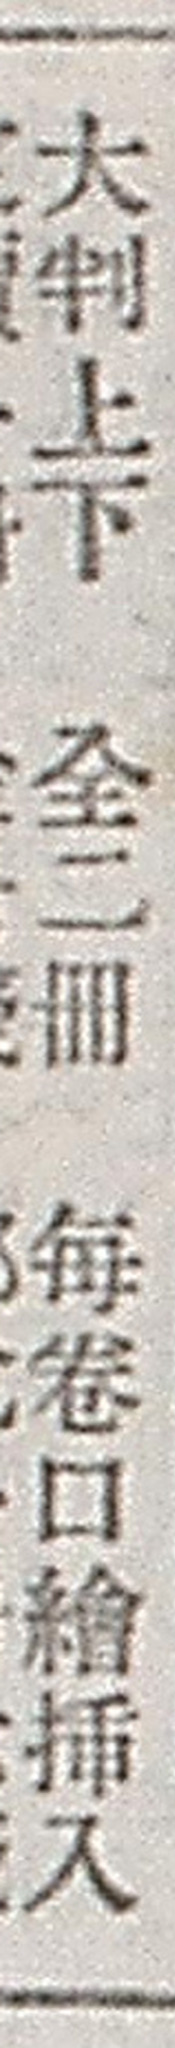大判上下全二冊毎巻口絵挿入
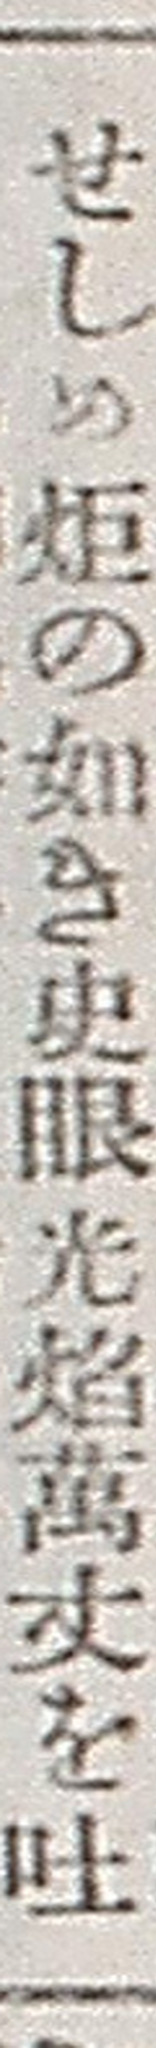せしめ炬の如き史眼光焔万丈を吐
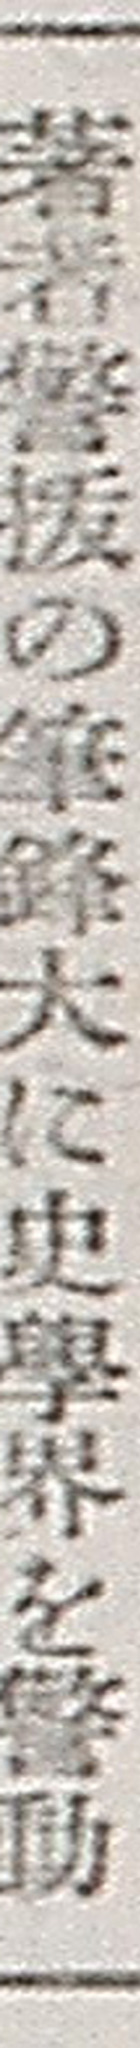著書警抜の筆鋒大に史学界を警動
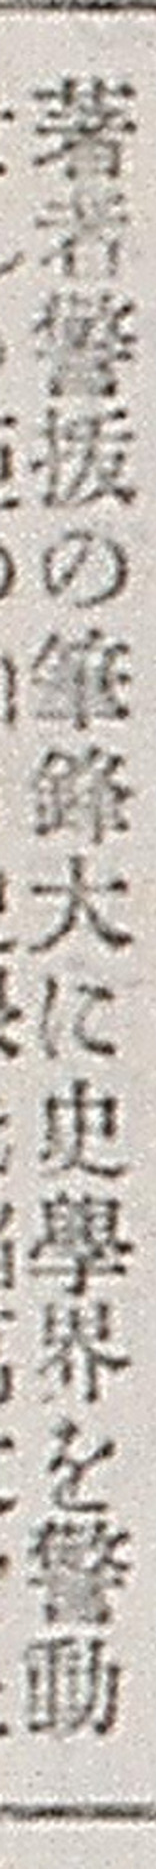著書警抜の筆鋒大に史学界を警動
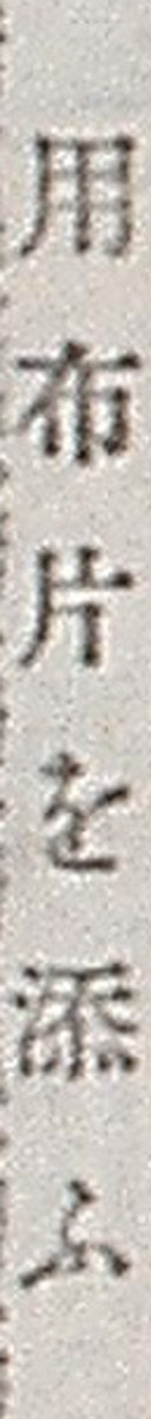用布片を添ふ
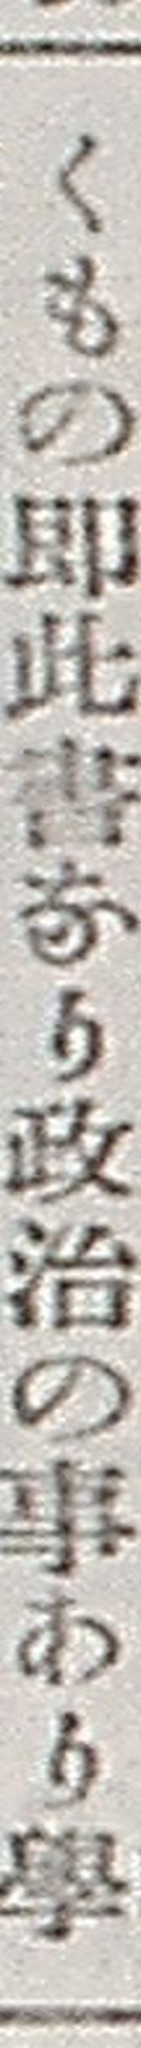くもの即此書なり政治の事あり学
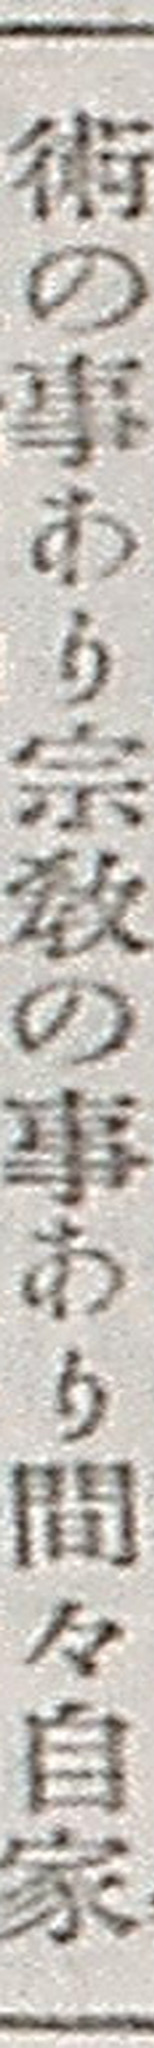術の事あり宗教の事あり間々自家
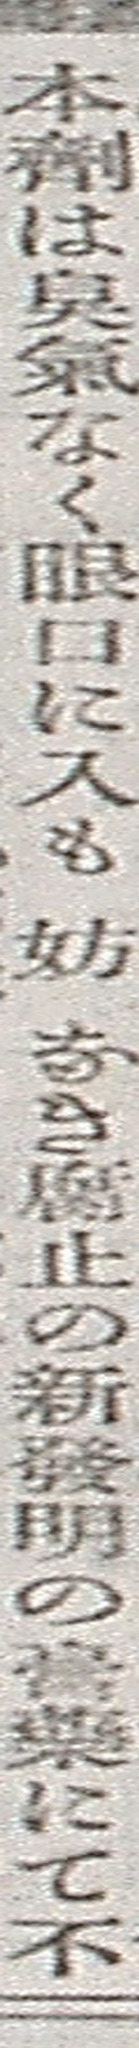本剤は臭気なく眼口に入も妨なき腐止の新発明の膏薬にて不
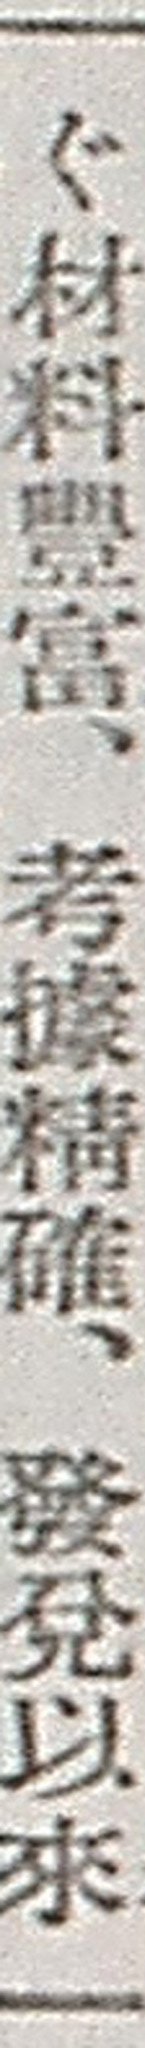ぐ材料豊富、考拠精確、発兌以来
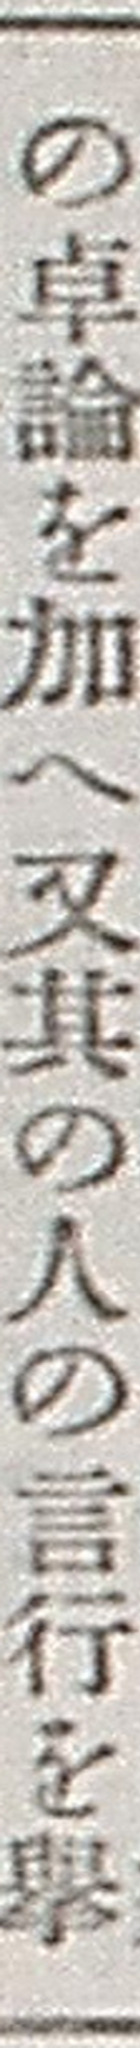の卓論を加へ又其の人の言行を挙
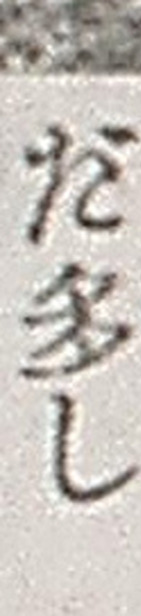だ多し
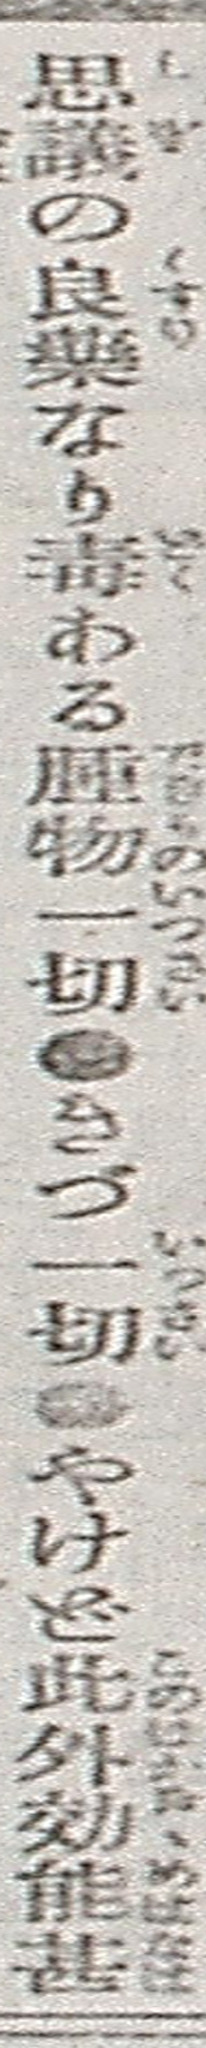思議の良薬なり毒ある腫物一切●きづ一切●やけど此外効能甚
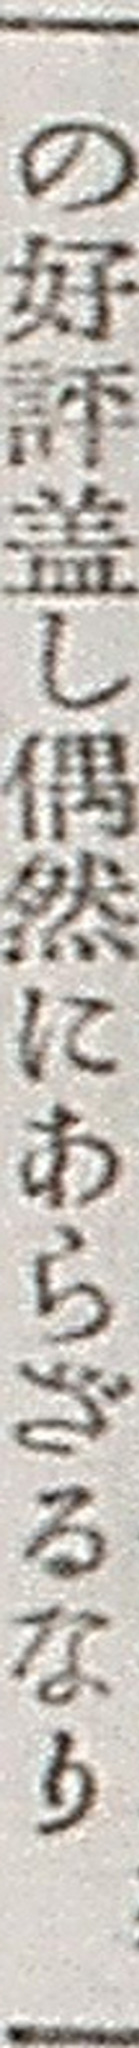の好評盖し偶然にあらざるなり
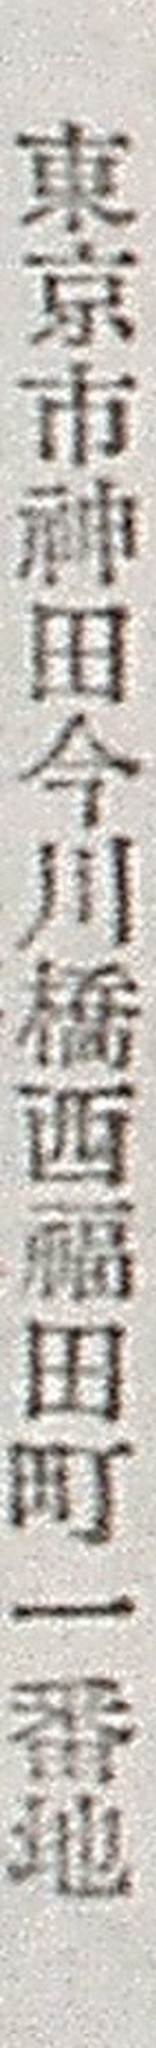東京市神田今川橋西福田町一番地
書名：風俗畫報臨時増刊第百二十號　大海嘯被害録（下）
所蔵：東京大学地震研究所図書室 Earthquake Research Institute Library, The University of Tokyo, JAPAN
